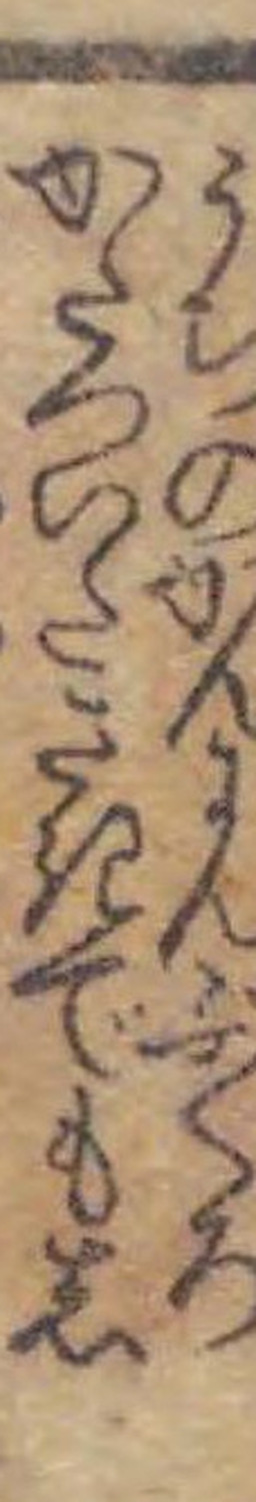かたついたさきでもし
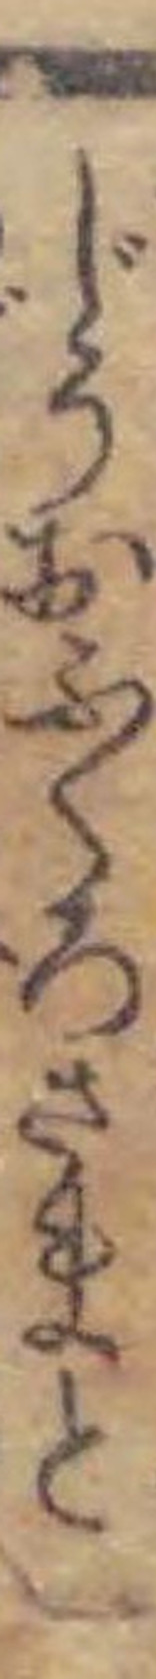じうおふくろさまと
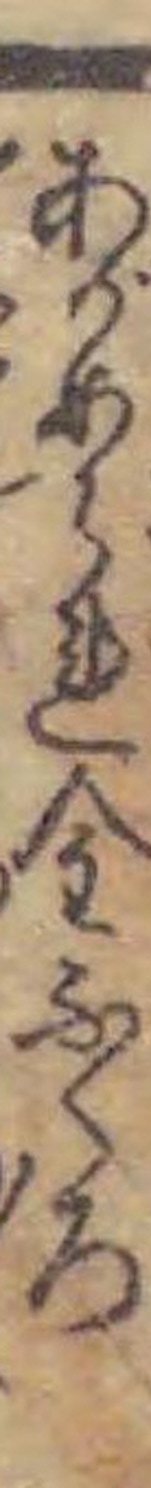あがめられ金ふくろ
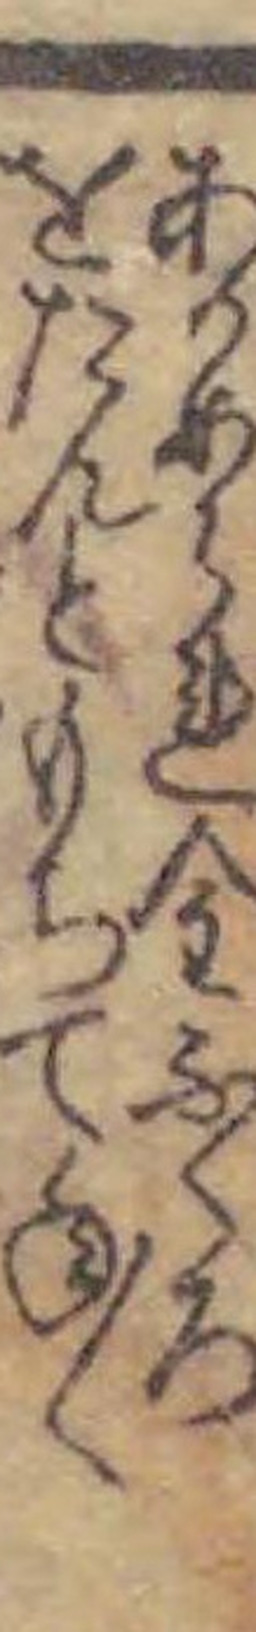をたんともちて年〳〵
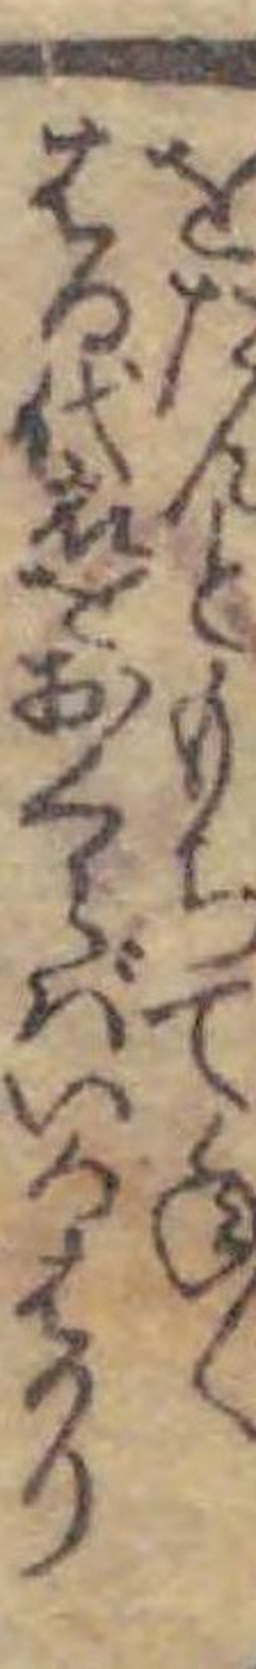はる袋をおくらばいかはかり
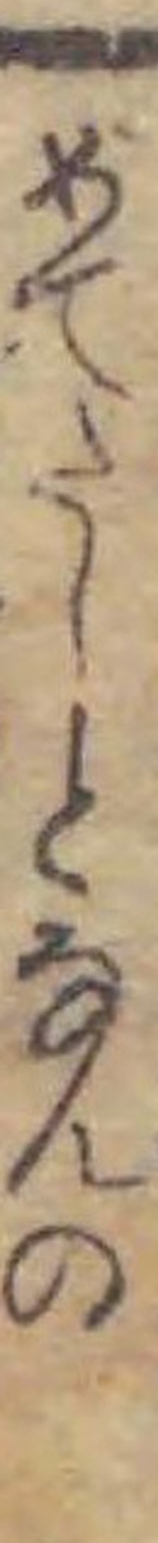めてたしとなんの
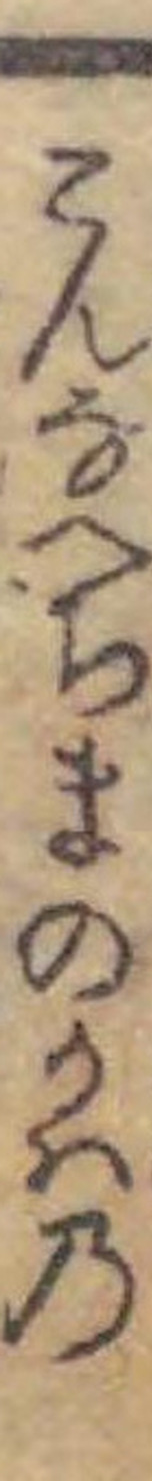こんなへちまのかはの
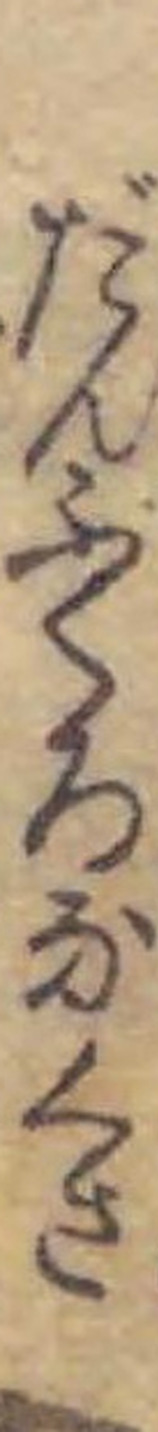だんぶくろなくさ
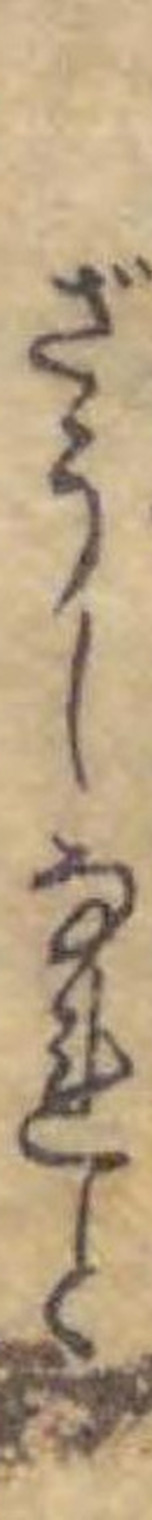ざうしなれと
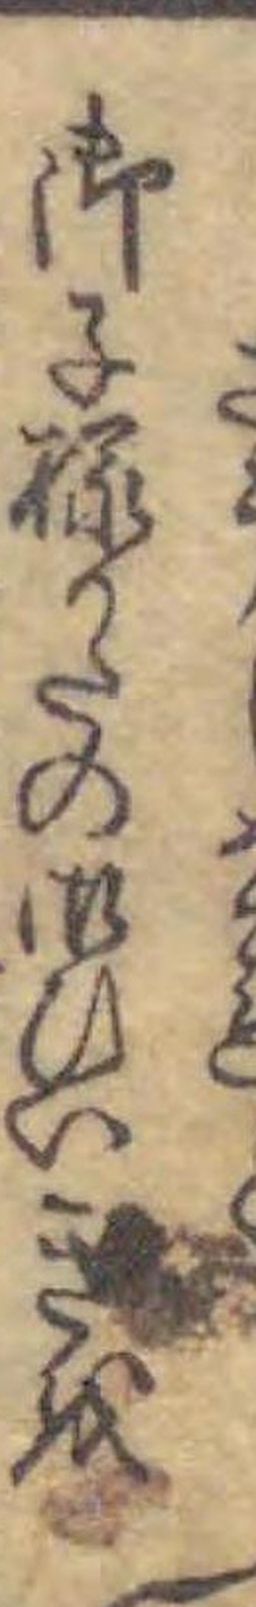御子様かたの御ひいきを
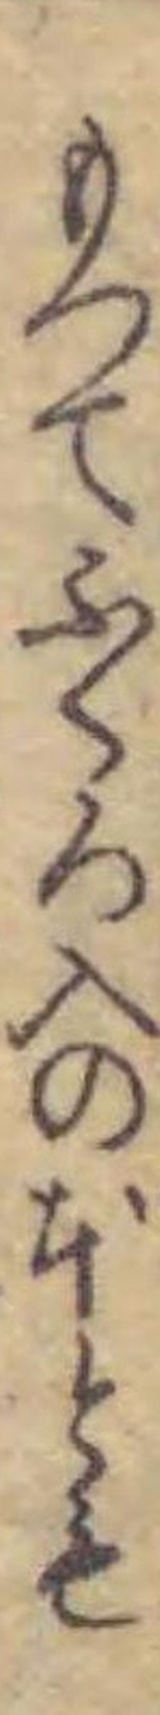もつてふくろ入の本とも
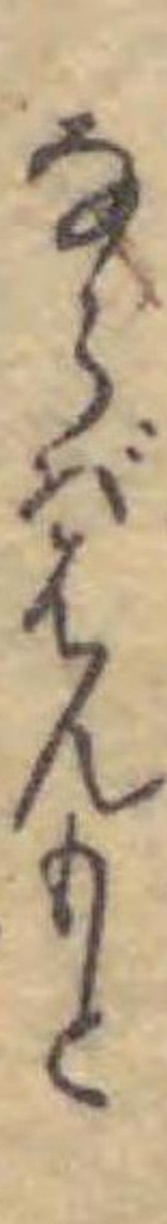ならばはんもと
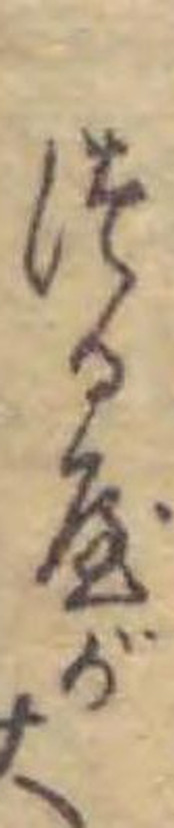つる屋が
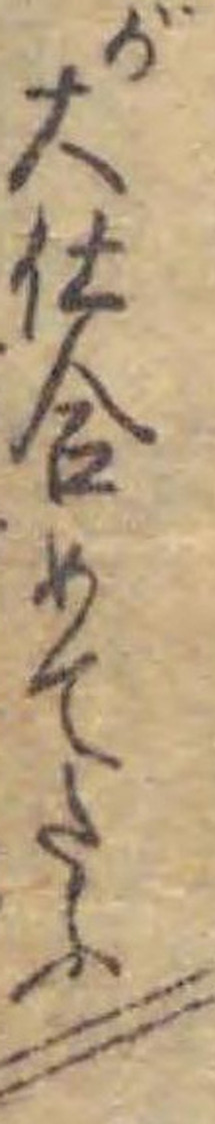大仕合めてたふ
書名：十四傾城腹之内 : 3巻
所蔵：国立国会図書館 National Diet Library, JAPAN
